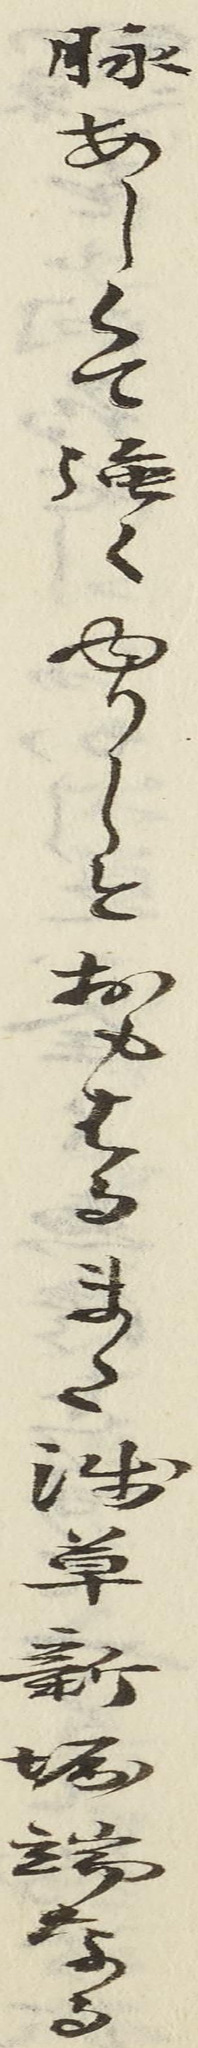脉あしくて強くゆりしとおもはるまた浅草新堀端なる
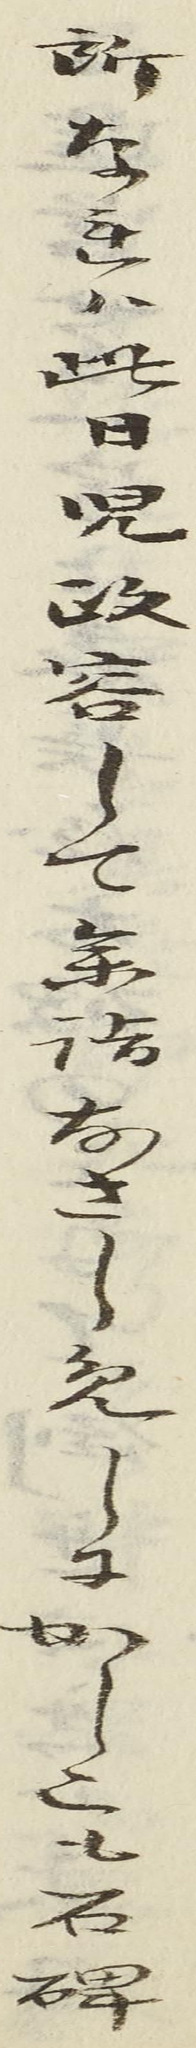所なれハ此日児改容して参詣なさしめしにかしこも石碑
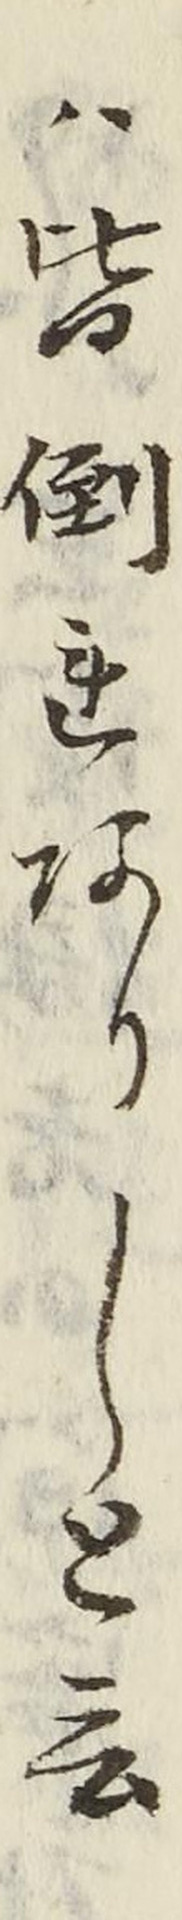ハ皆倒れなりしと云
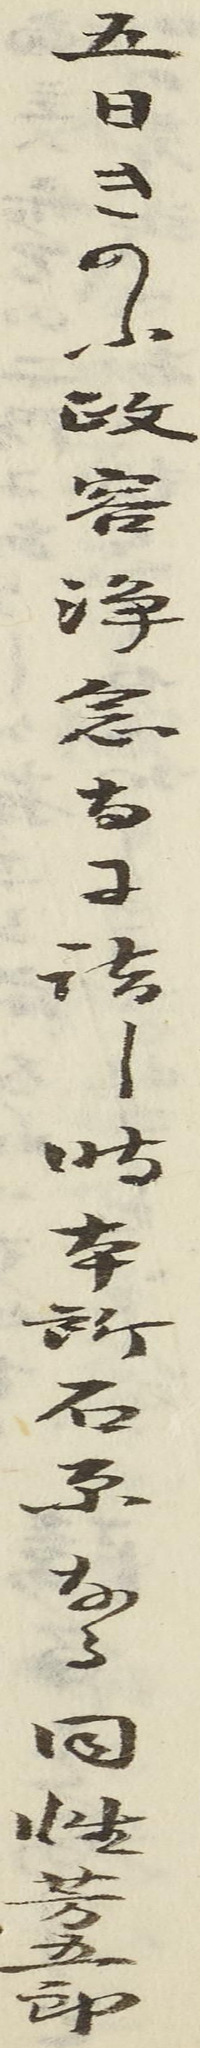五日きのふ改容淨念寺に詣し時本所石原なる同姓芳五郎
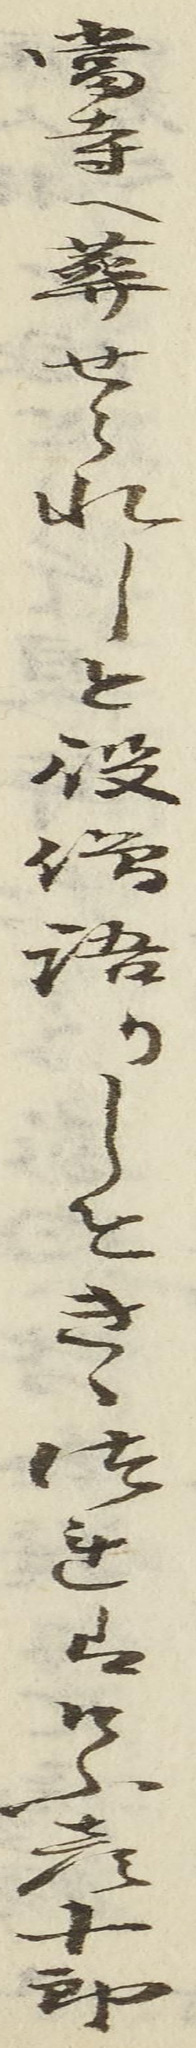当寺へ葬せられしと役僧語りしときゝつれはけふ彦十郎

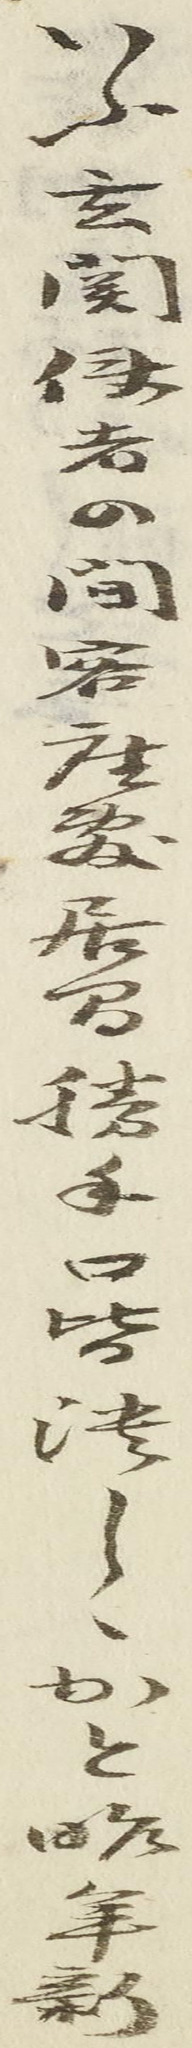いふ玄関使者の間客座敷居間勝手口皆潰しゝかと昨年新
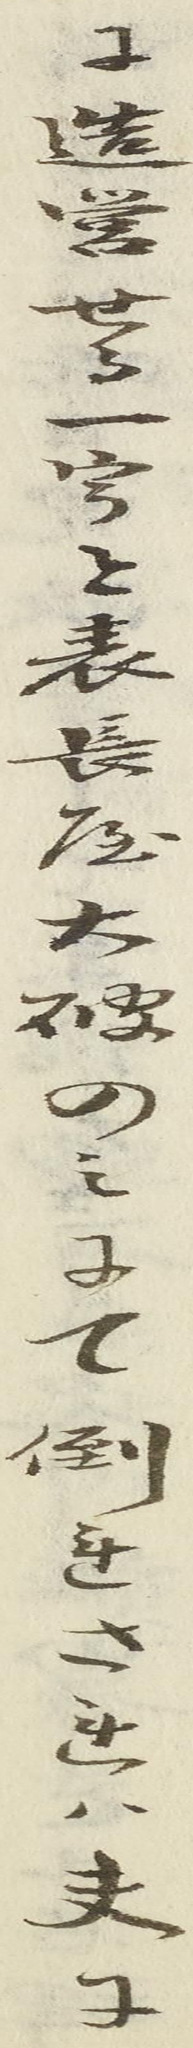に造営せる一宇と表長屋大破のミにて倒れされハ夫に
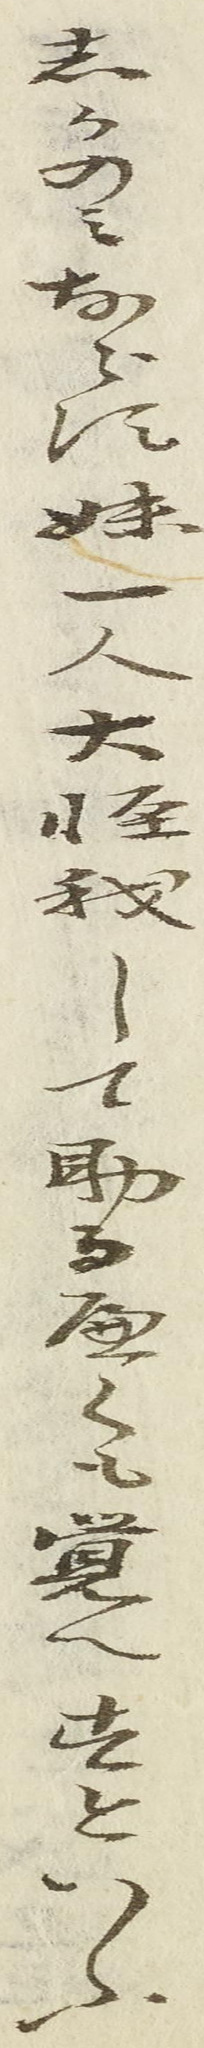しかのミならす妹一人大怪我して助るへくも覚へすといふ
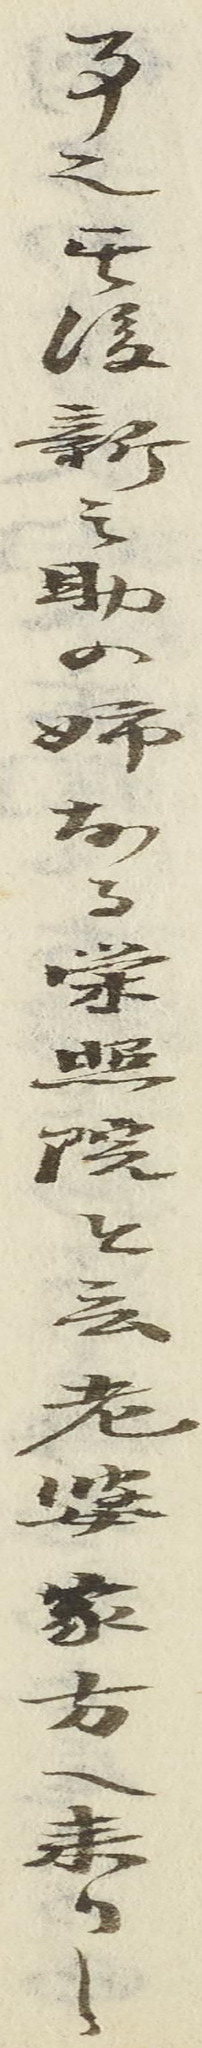事也其後新之助の姉なる栄照院と云老婆家方へ来りし
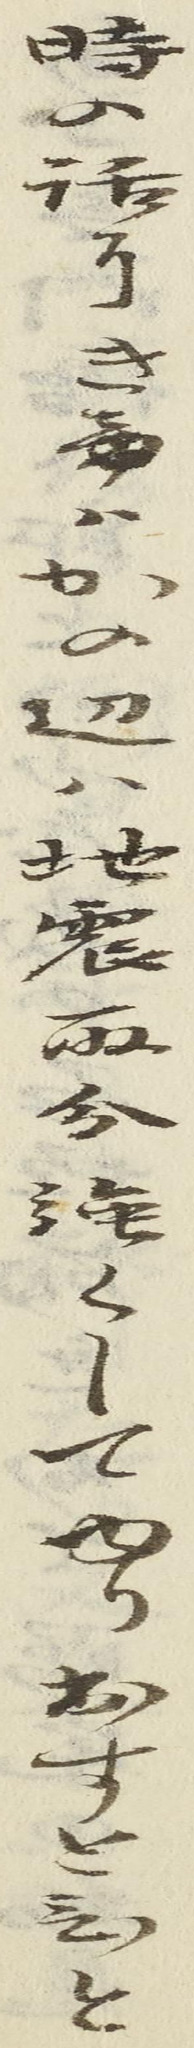時の話にきけハかの辺ハ地震取分強くしてゆり出すとひと
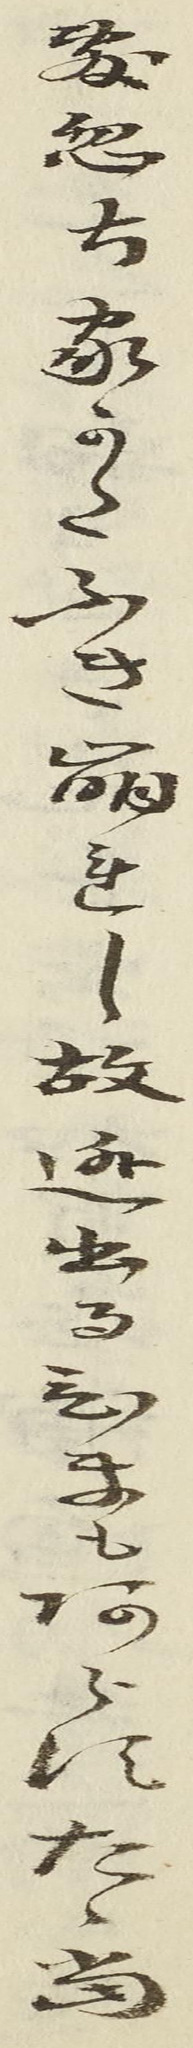敷忽ち家かたふき崩れし故逃出るひまもならすたゝ当
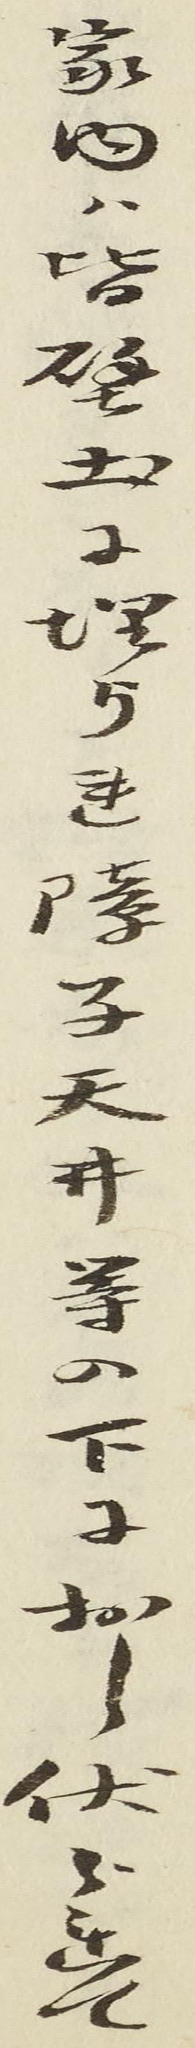家内ハ皆壁土に埋られ障子天井等の下におし伏られて
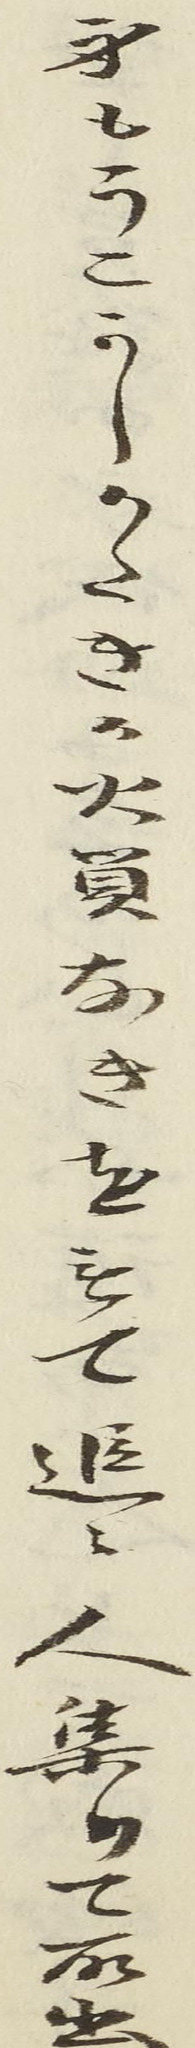身もうこかしかたきか火災なきをもて追々人集りて取出
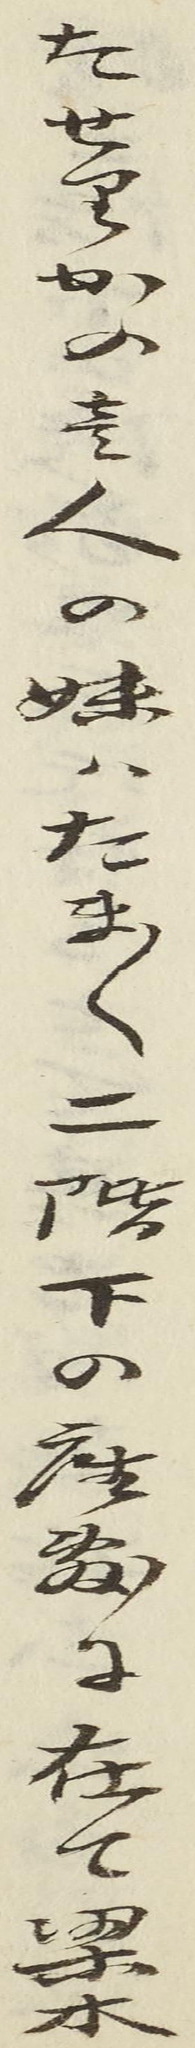なせりかの壱人の妹ハたま〳〵二階下の座敷に在て梁木
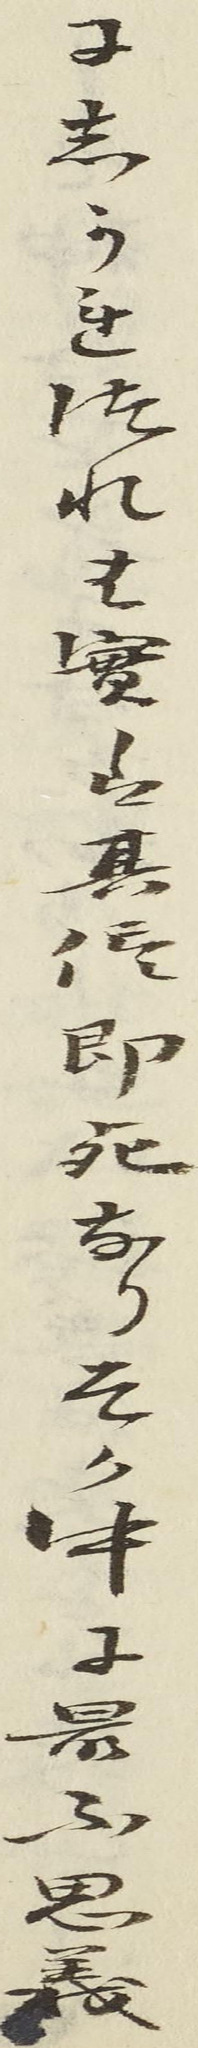にしかれつれは実ハ其儘即死なりそか中に最ふ思義
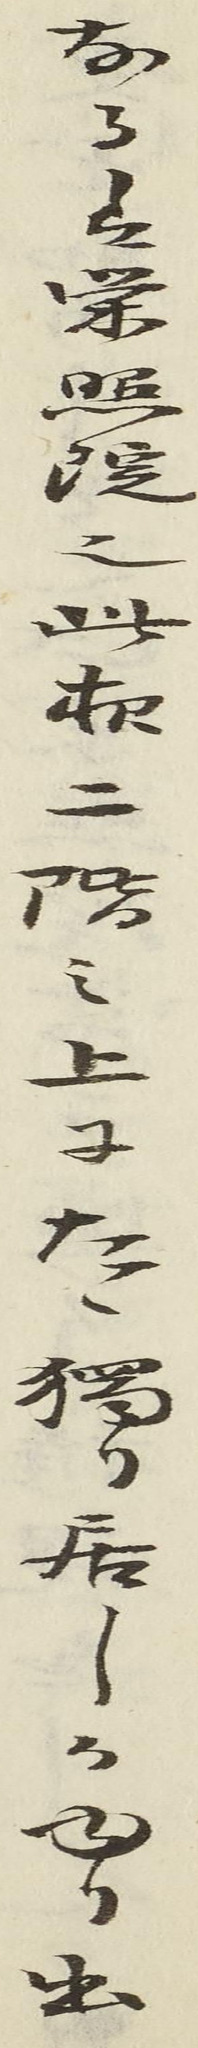なるは栄照院也此夜二階之上にたゝ独り居しかゆり出
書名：那為の後見艸　全
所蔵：東京大学地震研究所図書室 Earthquake Research Institute Library, The University of Tokyo, JAPAN
